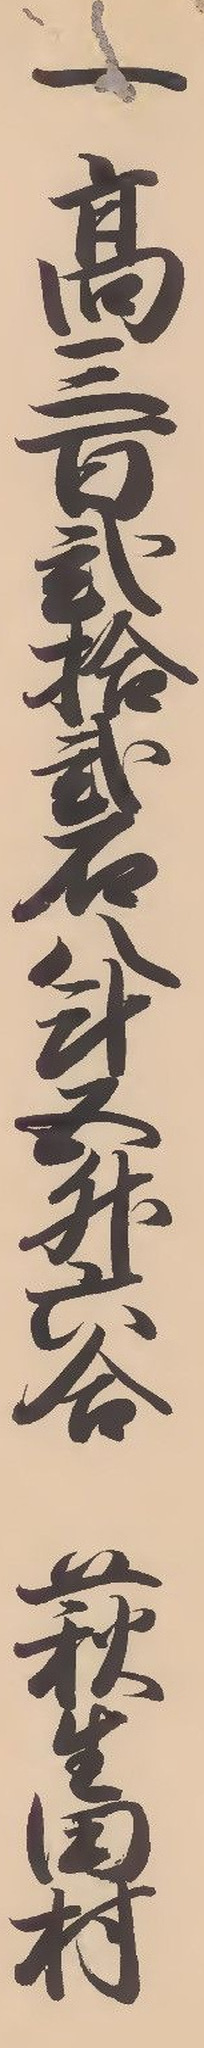一高三百弐拾弐石八斗五升六合萩生田村
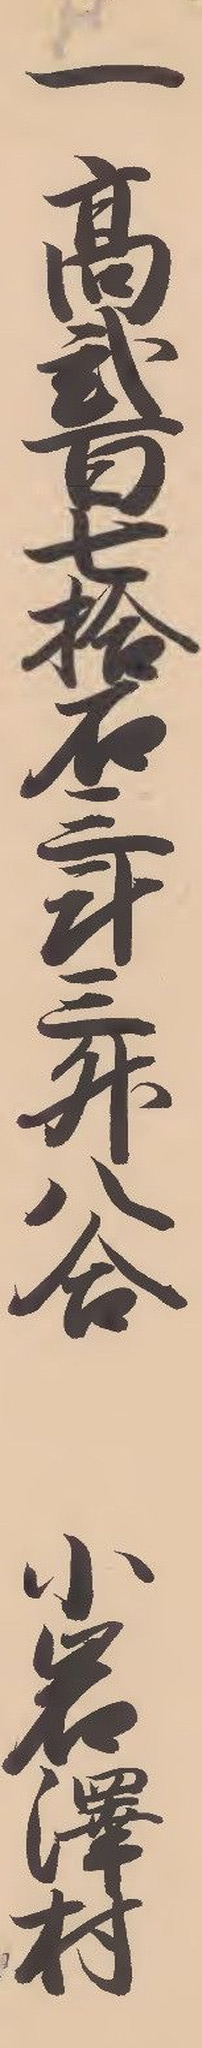一高弐百七拾石三斗三升八合小岩沢村
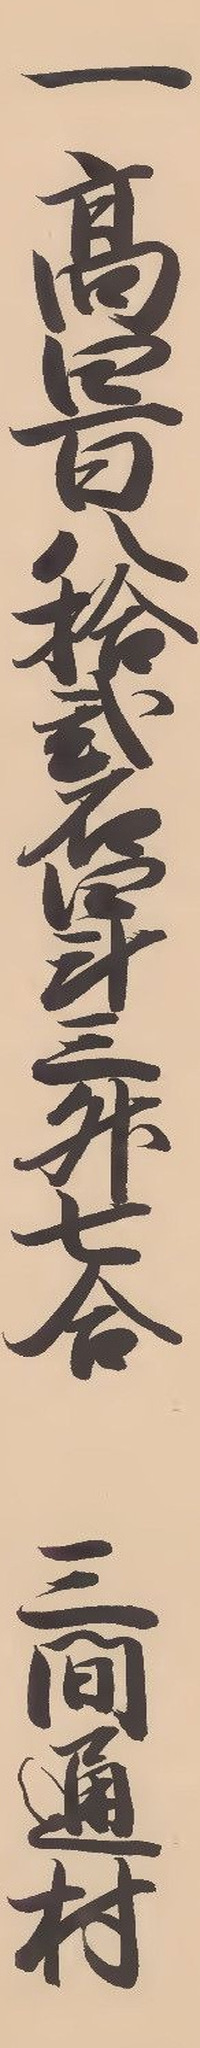一高四百八拾弐石四斗三升七合三間通村
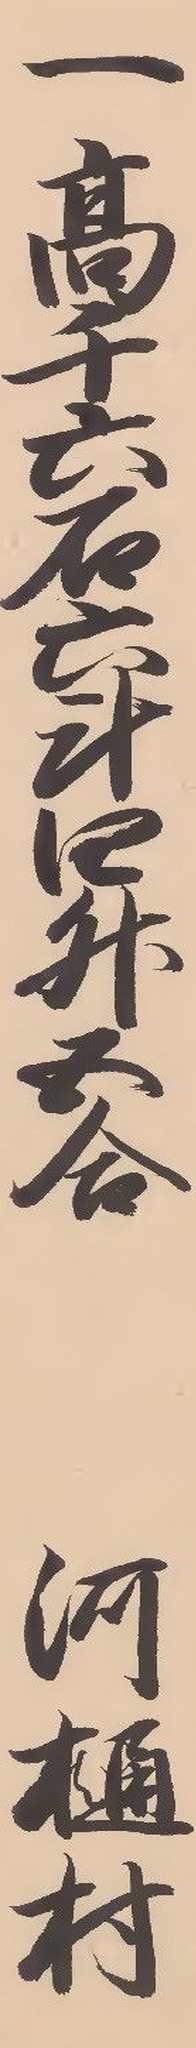一高千六石六斗四升五合河樋村
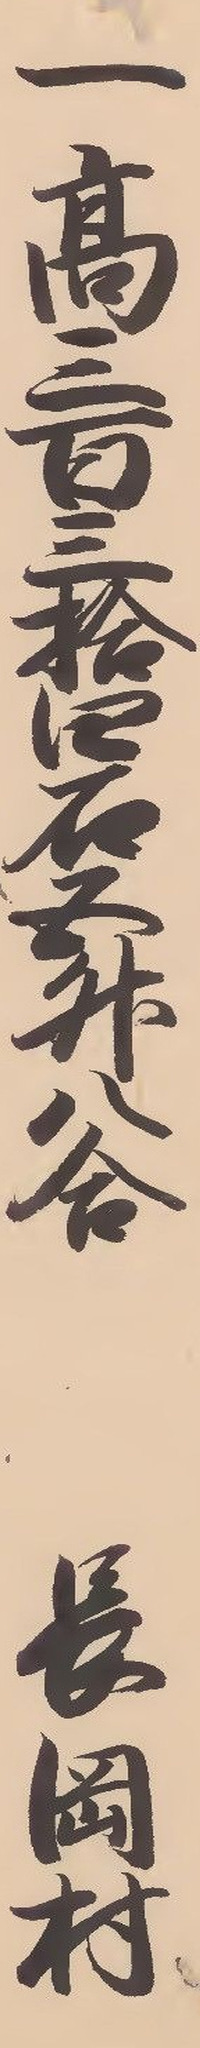一高三百三拾四石五升八合長岡村
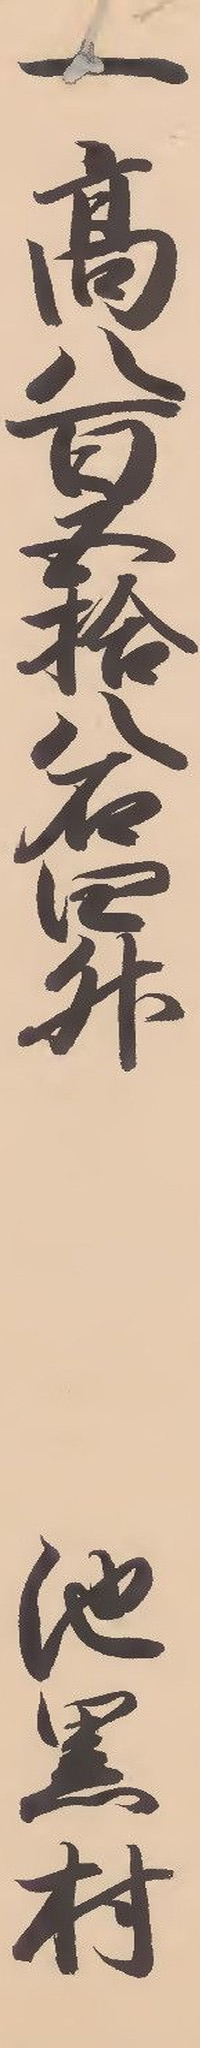一高八百五拾八石四升池黒村
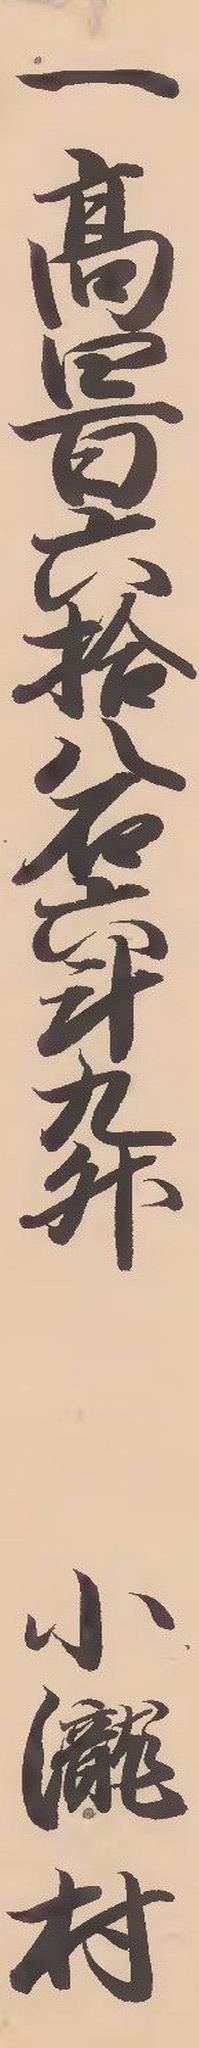一高四百六拾八石六斗九升小滝村

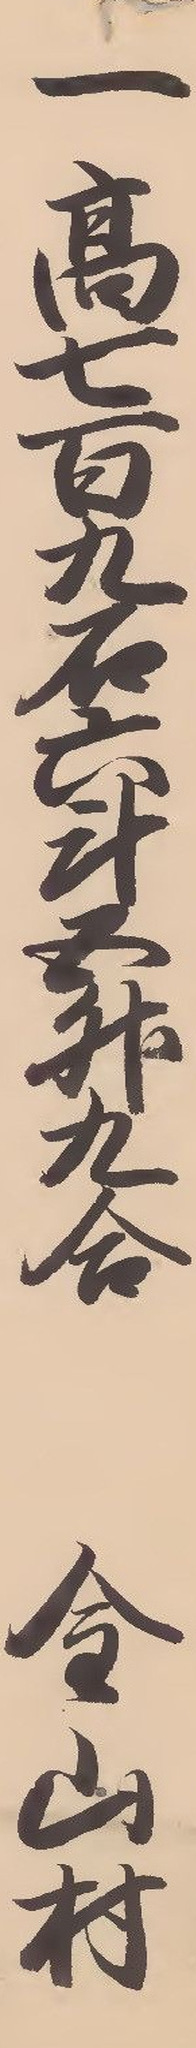一高七百九石六斗五升九合金山村
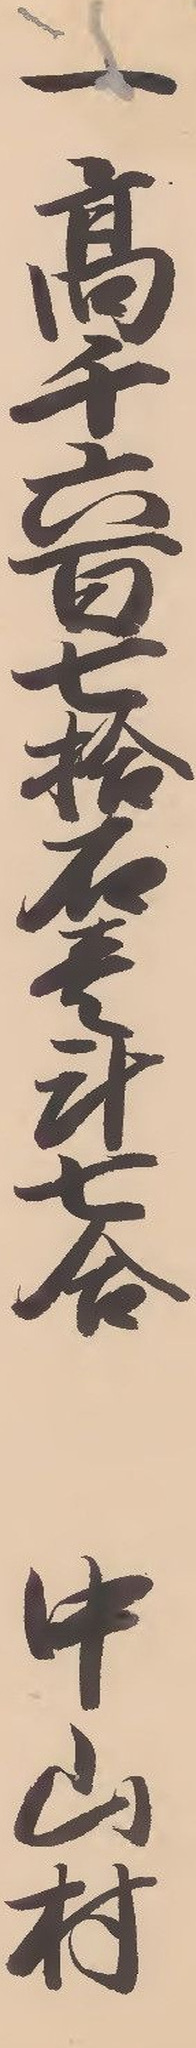一高千六百七拾石壱斗七合中山村
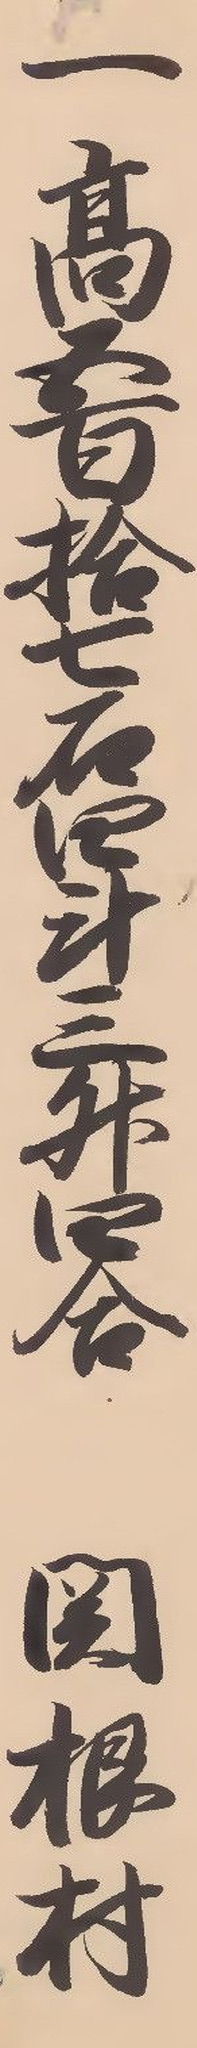一高五百拾七石四斗三升四合関根村
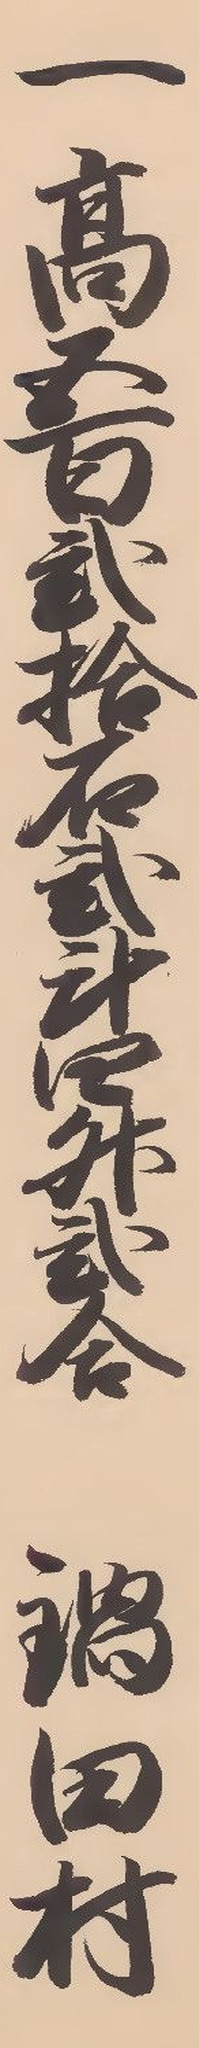一高五百弐拾石弐斗四升弐合鍋田村
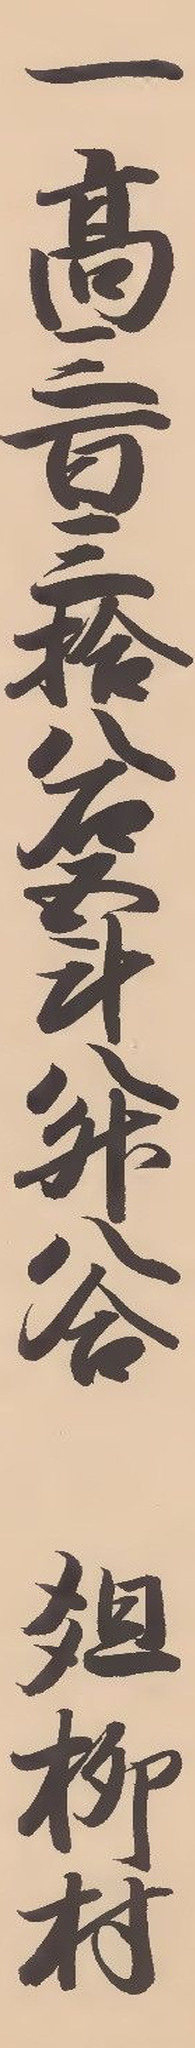一高三百三拾八石五斗八升八合俎柳村
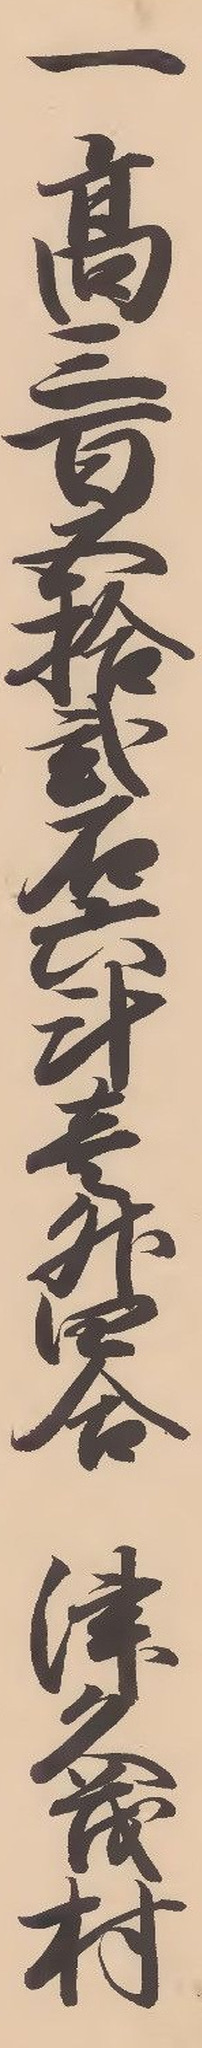一高三百五拾弐石六斗壱升四合津久茂村
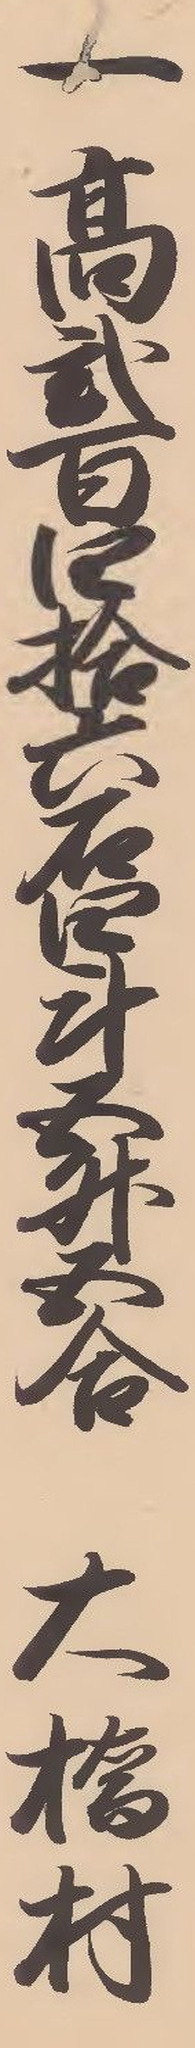一高弐百四拾六石四斗五升五合大橋村
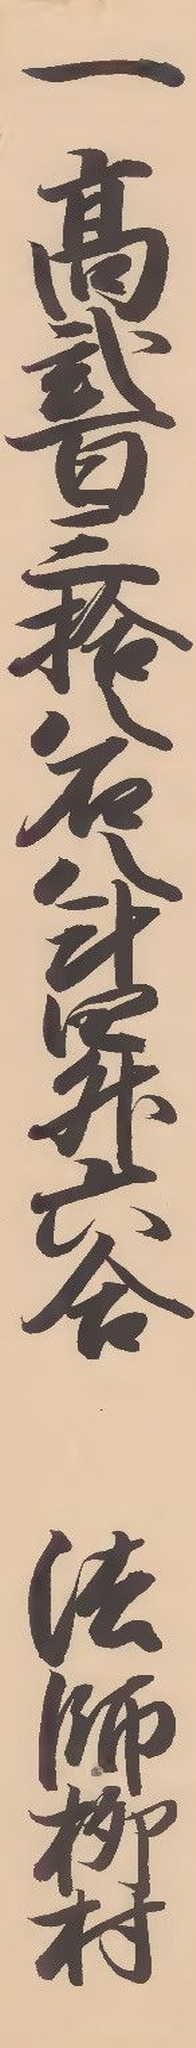一高弐百三拾八石八斗四升六合法師柳村

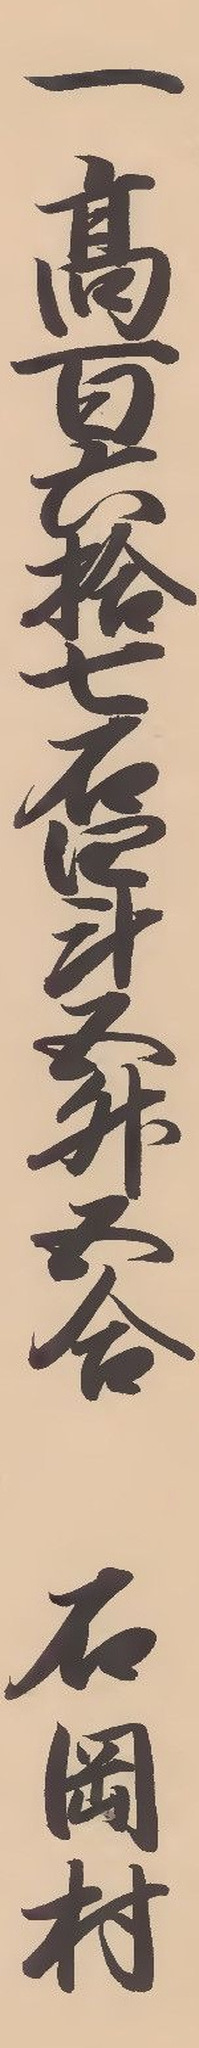一高百六拾七石四斗五升五合石岡村
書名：出羽国郷帳　１
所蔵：国立公文書館 National Archives of Japan
